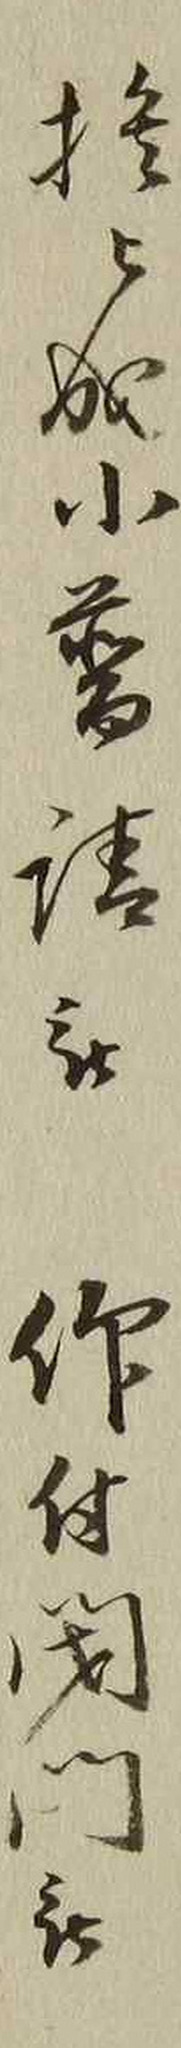捨被成小普請被仰付閉門被
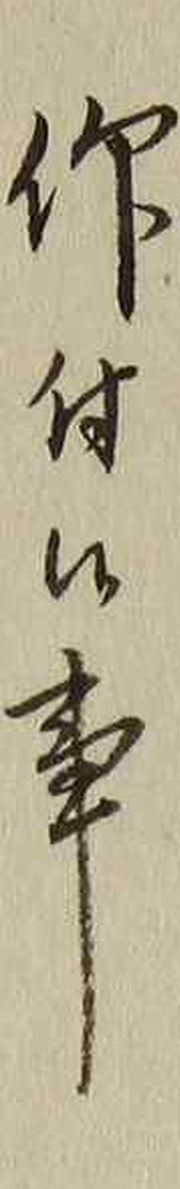仰付候事
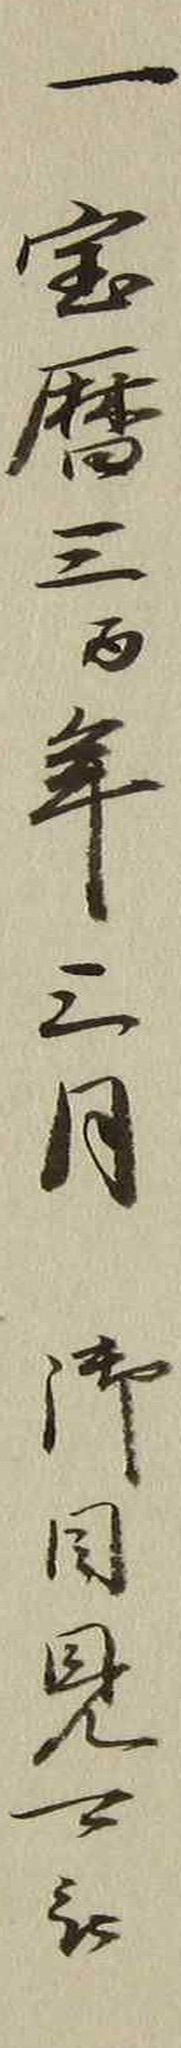一宝暦三酉年三月御目見可被
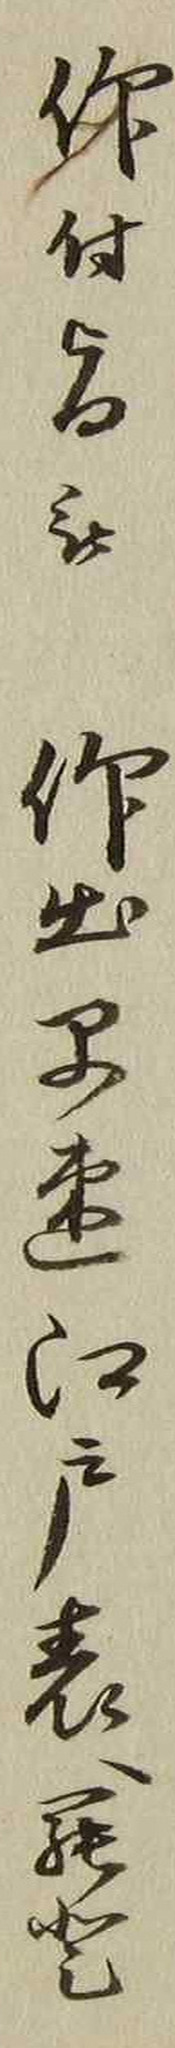仰付旨被仰出早速江戸表へ罷登
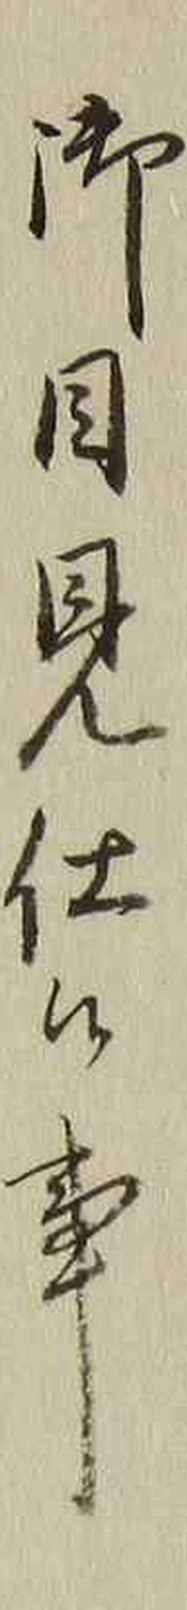御目見仕候事
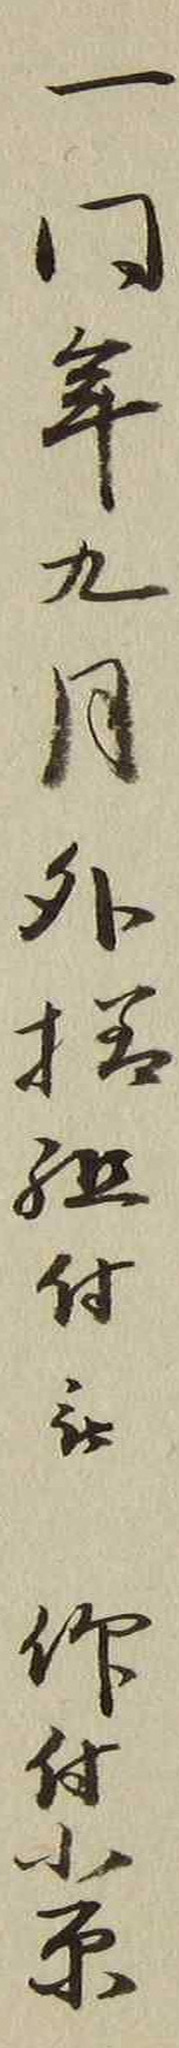一同年九月外様組付被仰付小原
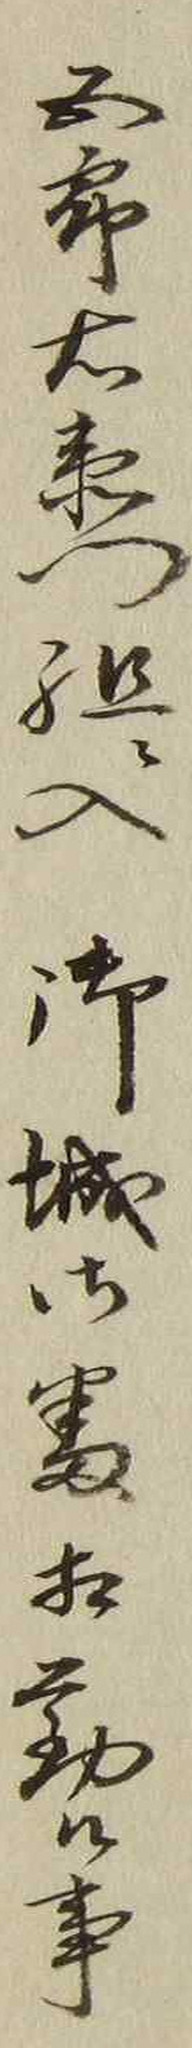五郎右衛門組ニ入御城御番相勤候事
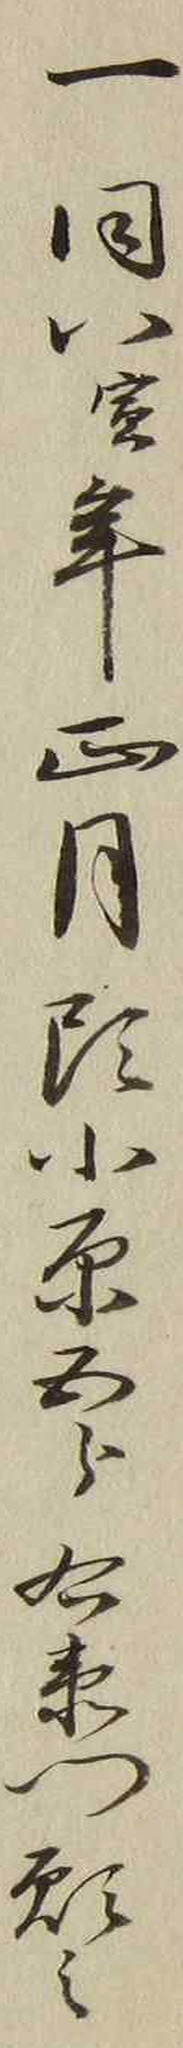一同八寅年正月頭小原五郎右衛門願之
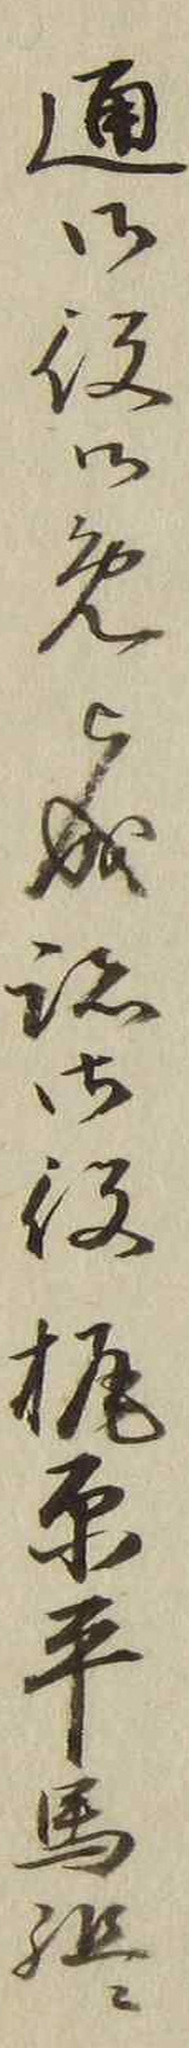通御役御免被成跡御役梶原平馬組ニ

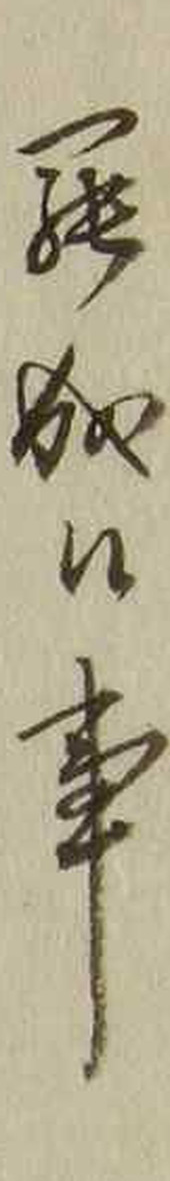罷成候事
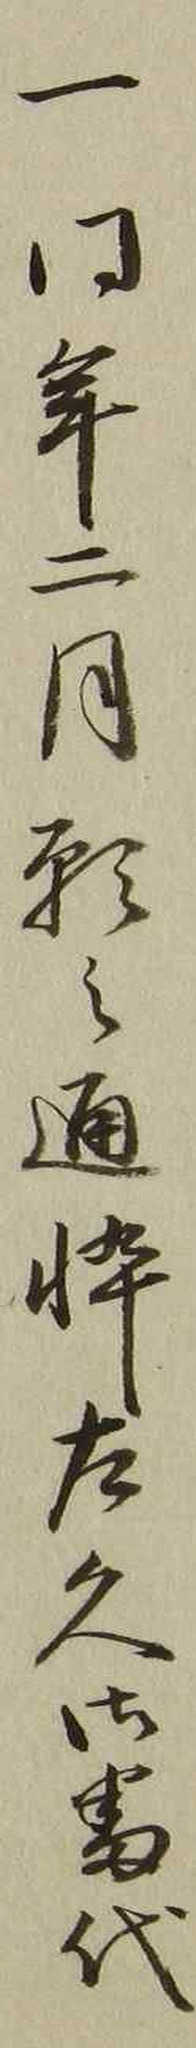一同年二月願之通忰左久御番代
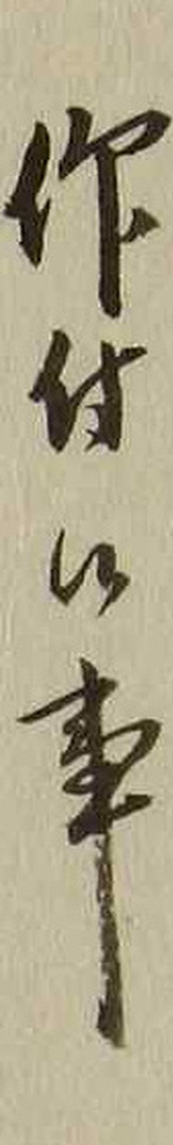仰付候事
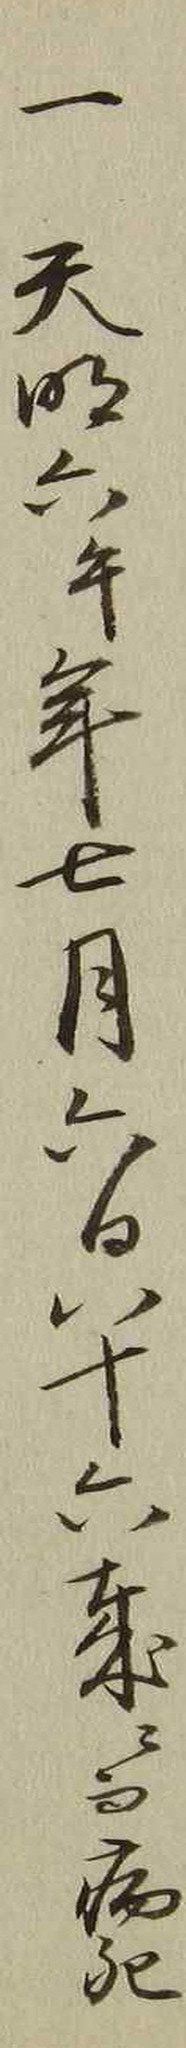一天明六午年七月六日八十六歳二而病死
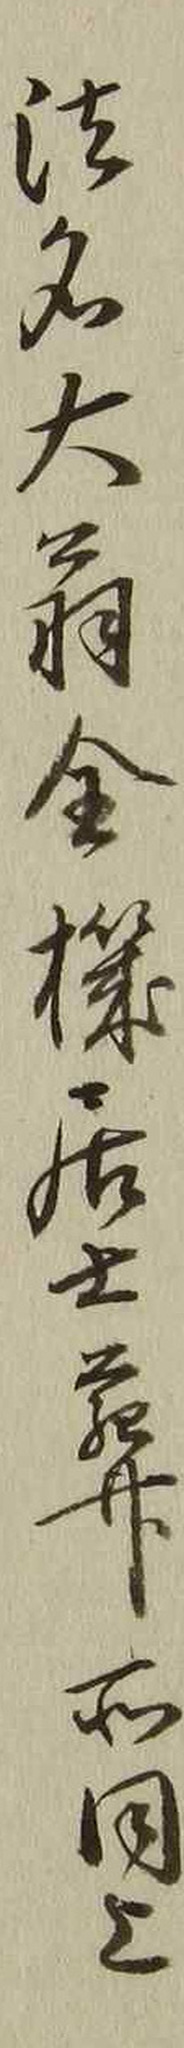法名大翁全機居士葬所同上
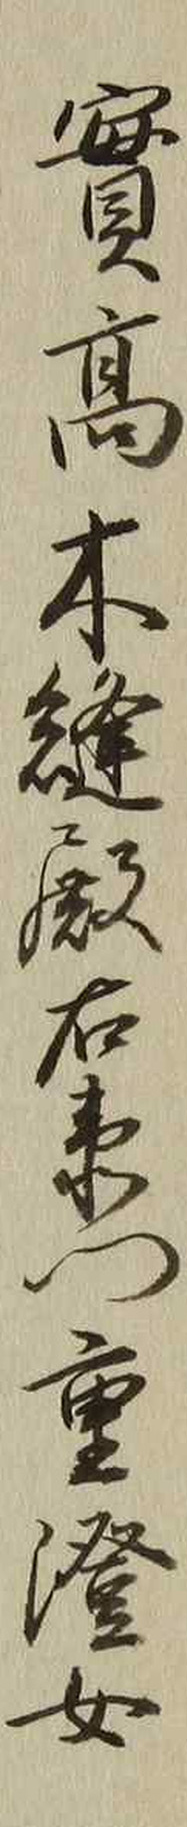実高木縫殿右衛門重澄女
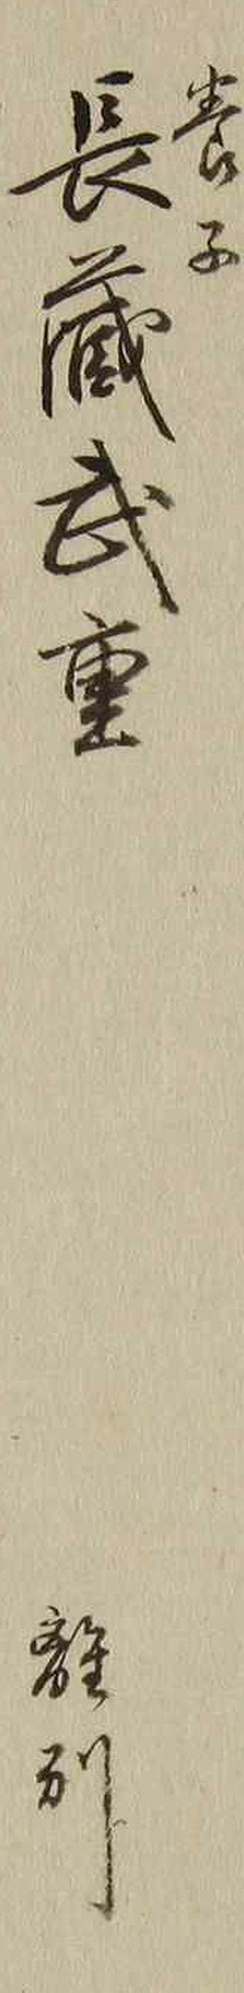長蔵武重離別
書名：諸士系譜　巻之128　た之部4
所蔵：会津若松市立会津図書館
